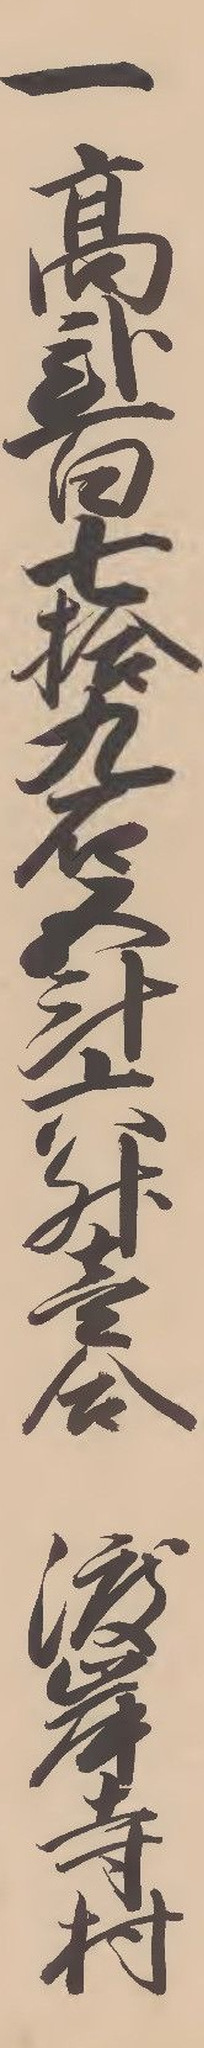一高弐百七拾九石五斗六升壱合渡岸寺村
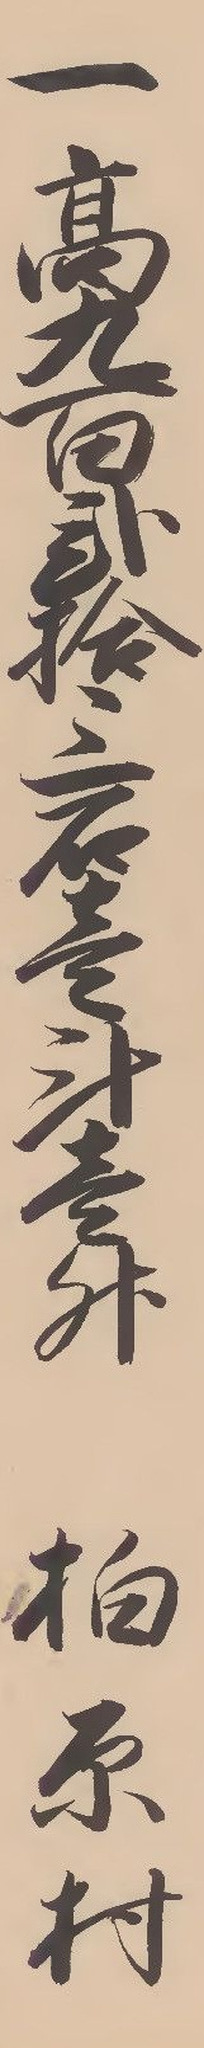一高九百弐拾三石壱斗壱升柏原村

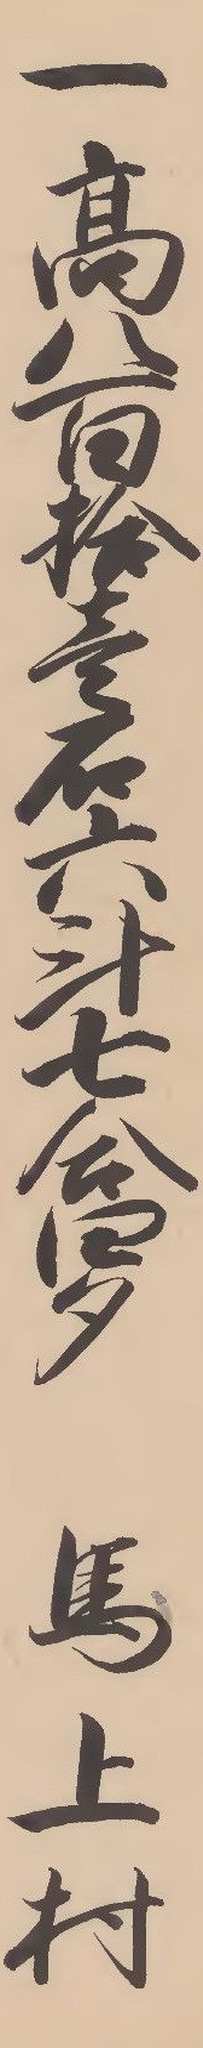一高八百拾壱石六斗七合四勺馬上村
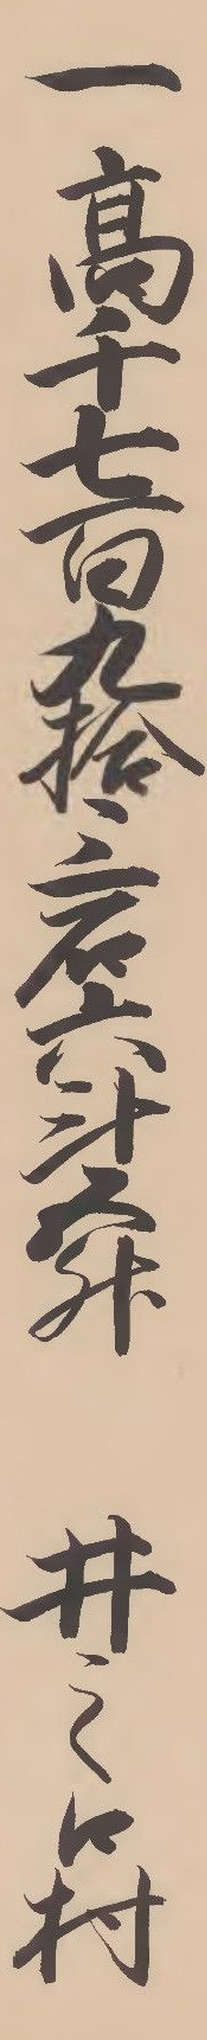一高千七百九拾三石六斗五升井之口村
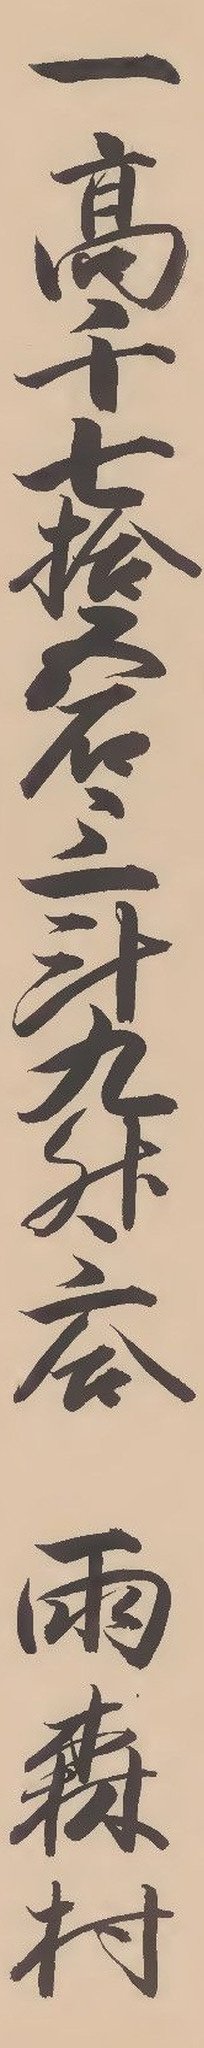一高千七拾五石三斗九升三合雨森村
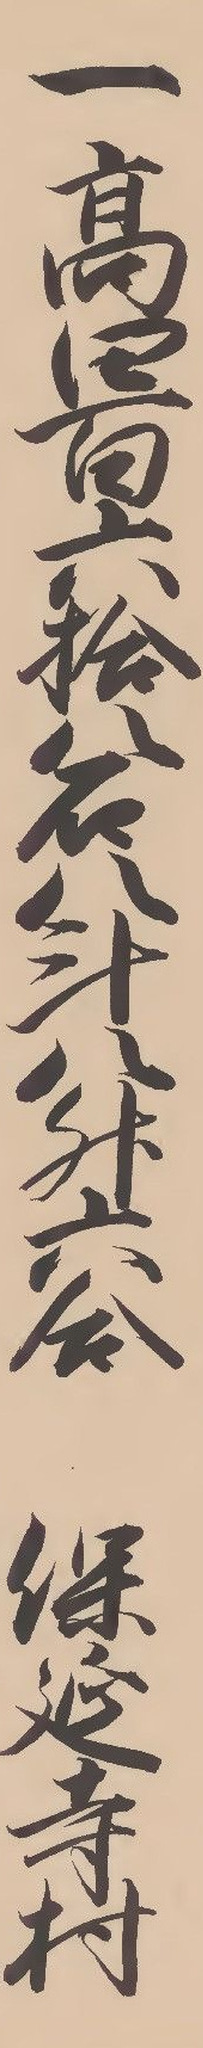一高四百六拾八石八斗八升六合保延寺村
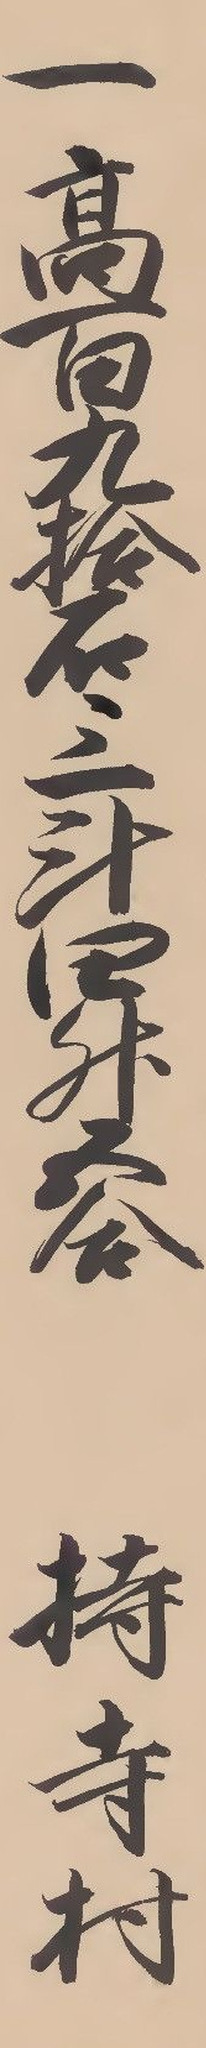一高百九拾石三斗四升五合持寺村
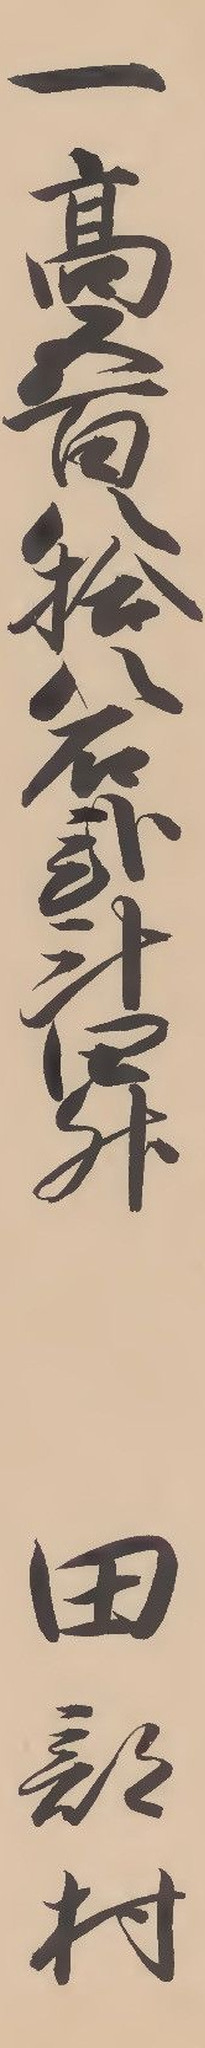一高五百八拾八石弐斗四升田部村
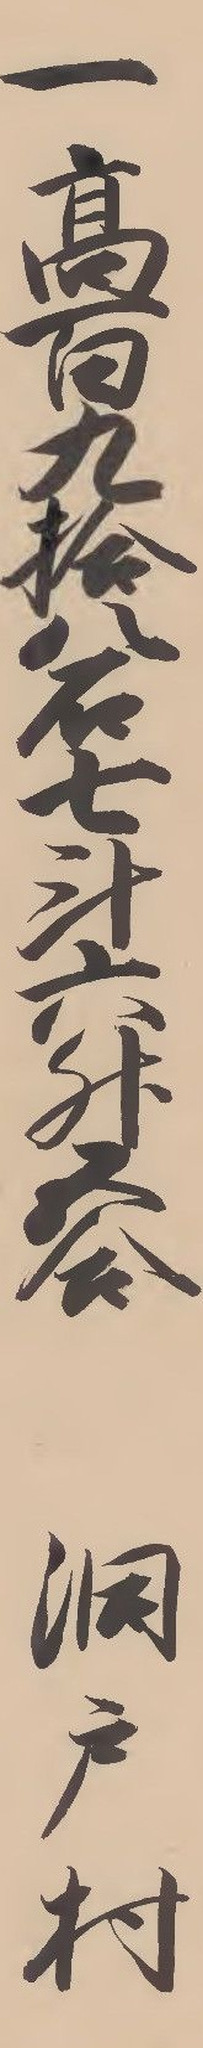一高百九拾八石七斗六升五合洞戸村
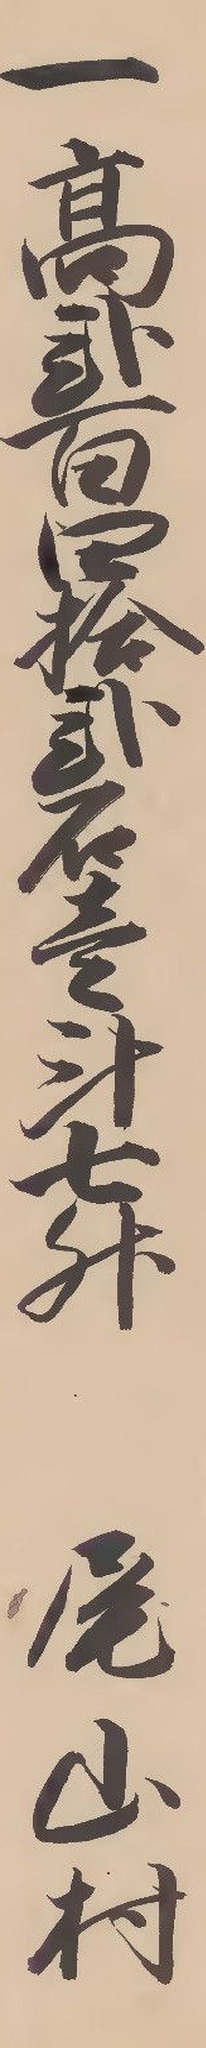一高弐百四拾弐石壱斗七升尾山村

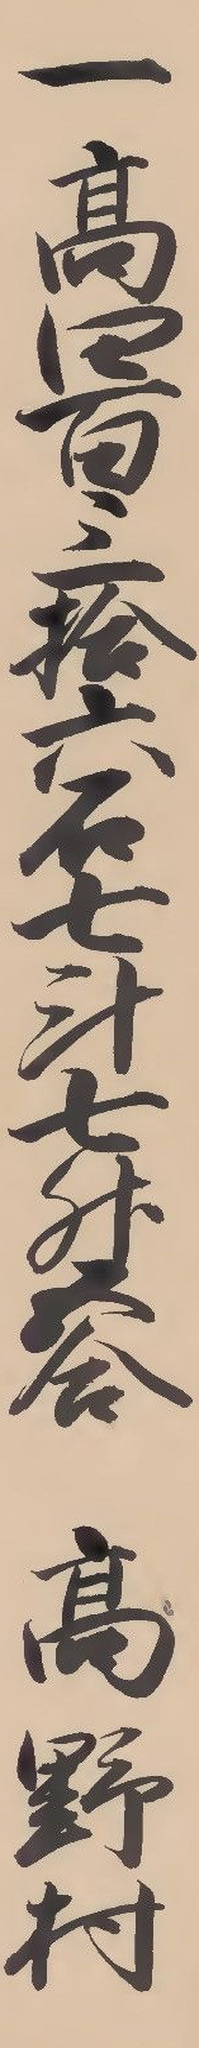一高四百三拾六石七斗七升五合高野村
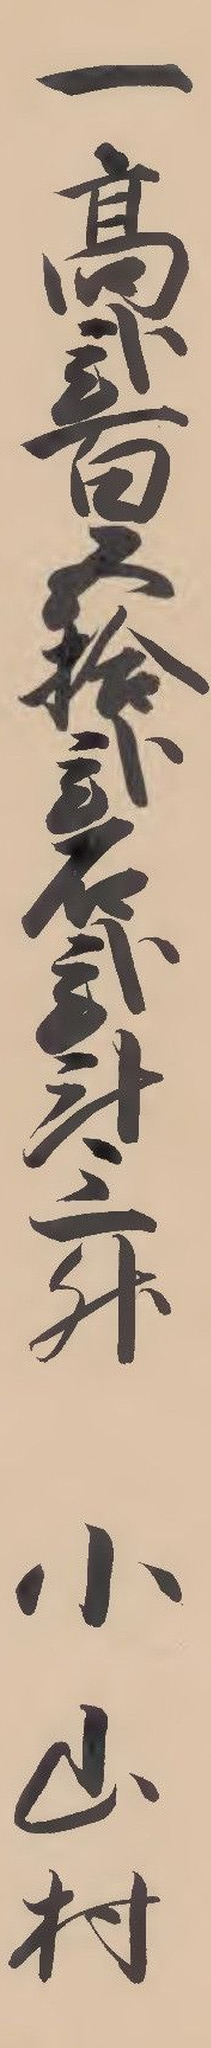一高弐百五拾弐石弐斗三升小山村
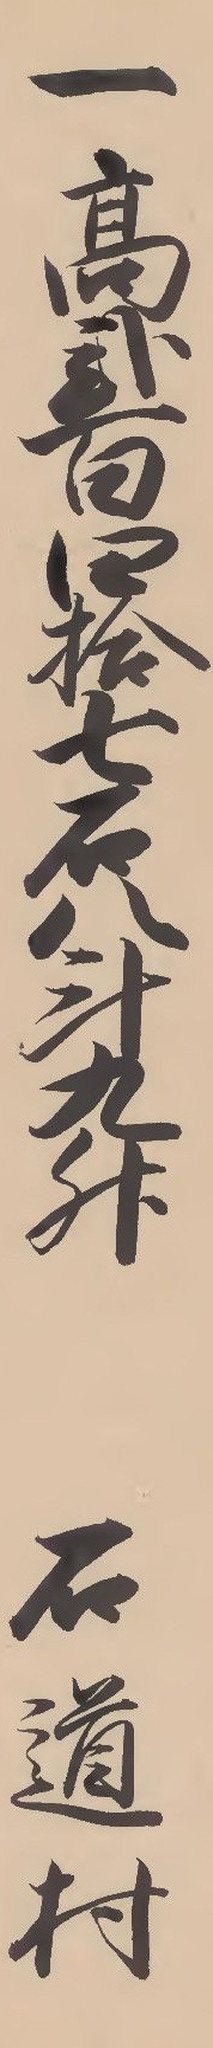一高弐百四拾七石八斗九升石道村
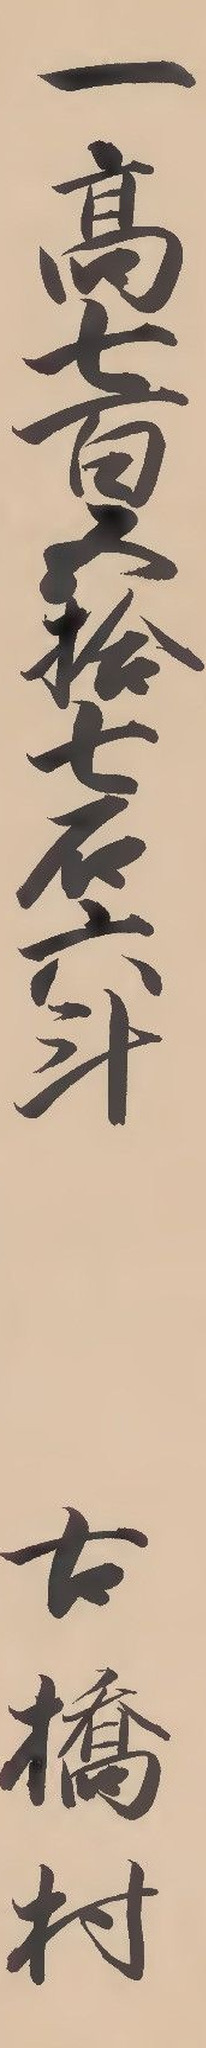一高七百五拾七石六斗古橋村
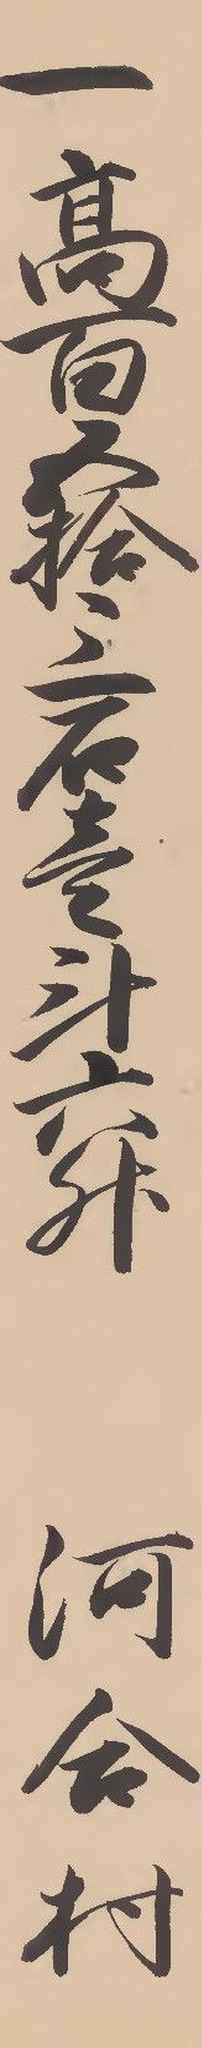一高百五拾三石壱斗六升河合村
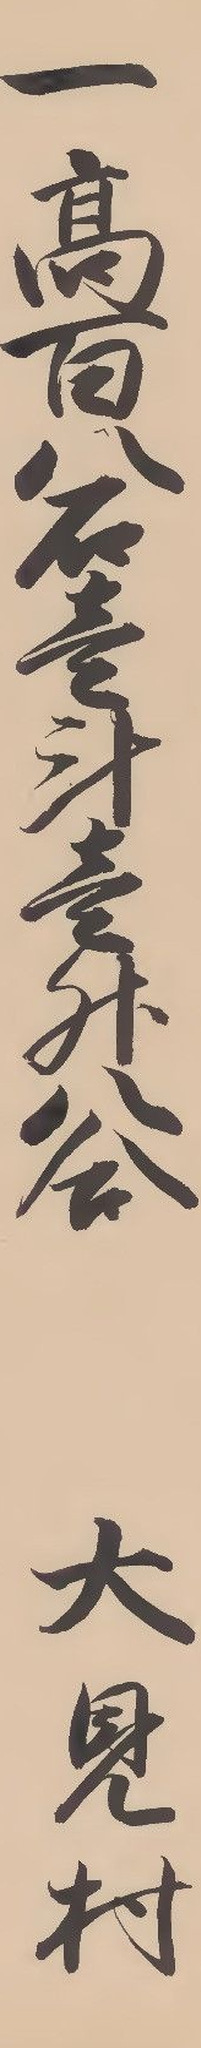一高百八石壱斗壱升八合大見村
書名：近江国郷帳
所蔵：国立公文書館 National Archives of Japan
